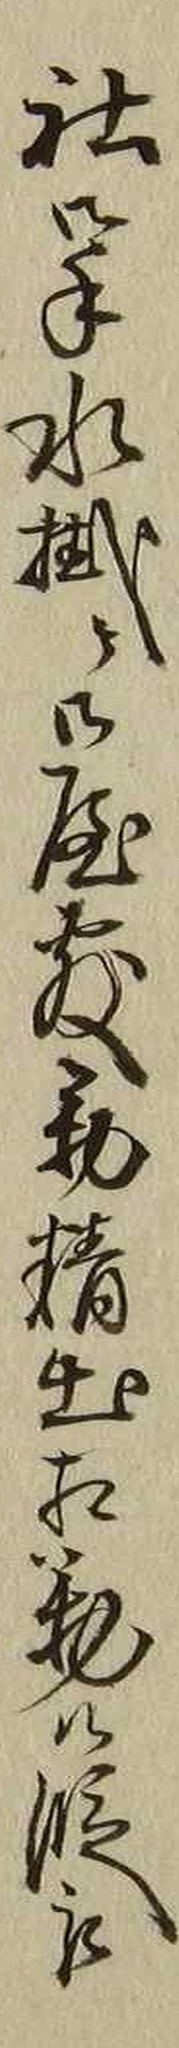社御手水掛り御屋敷勤精出相勤候段被
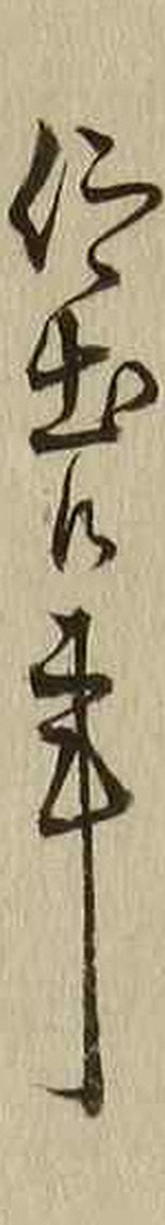仰出候事
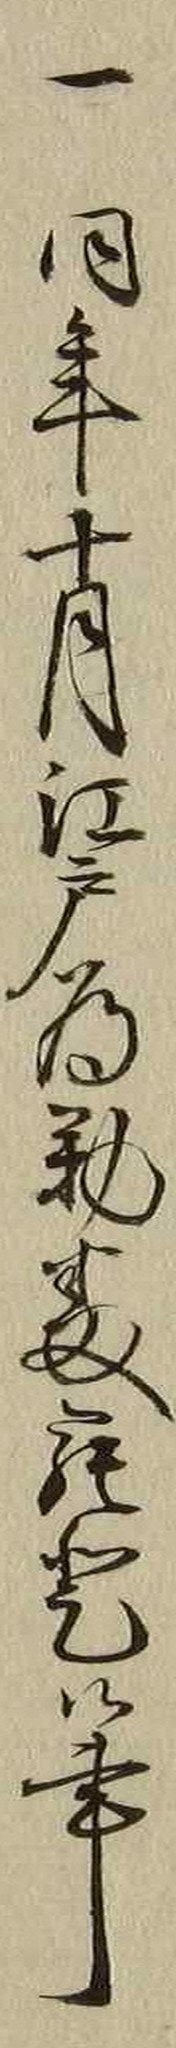一同年十月江戸為勤番罷登候事
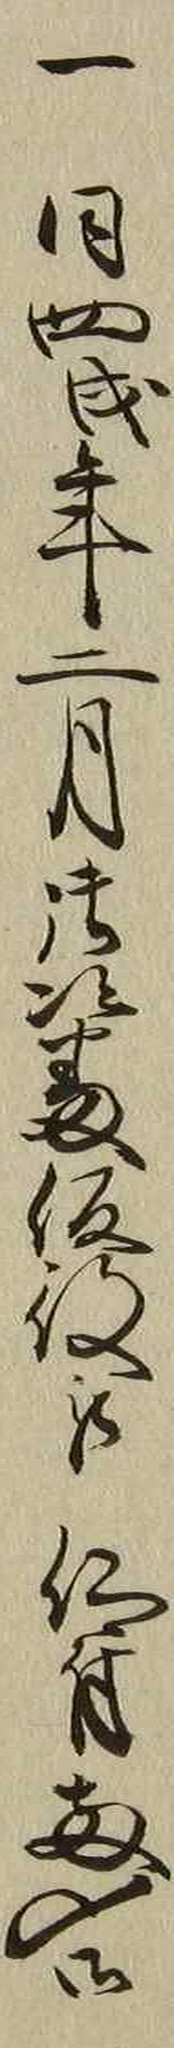一同四戌年二月御次番仮役被仰付両〆御
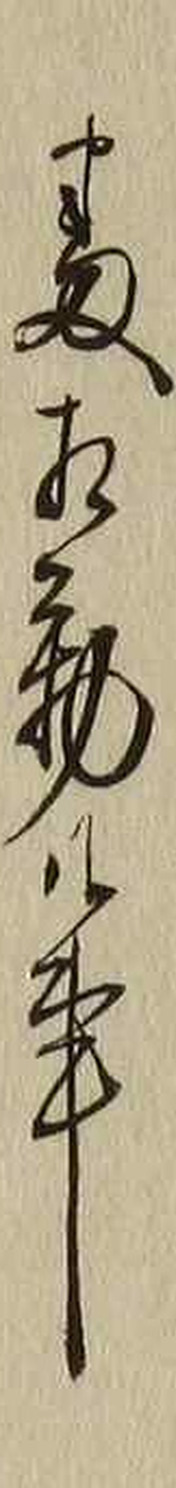番相勤候事
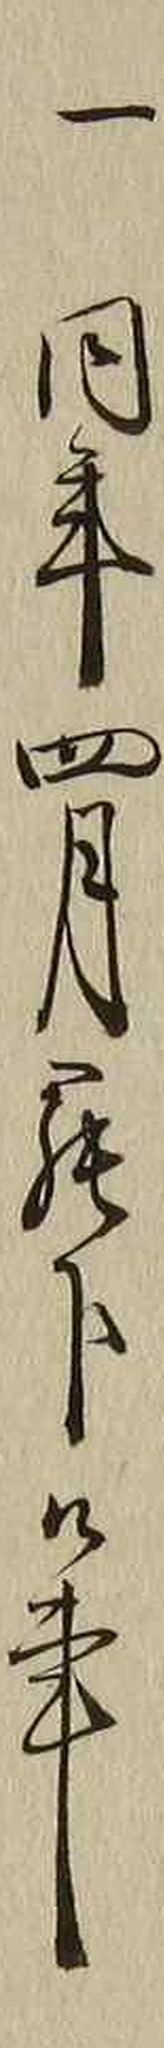一同年四月罷下候事
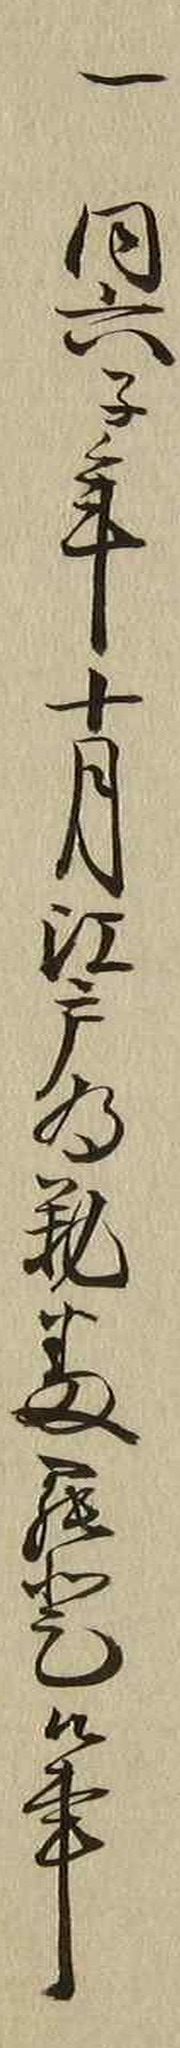一同六子年十月江戸為勤番罷登候事
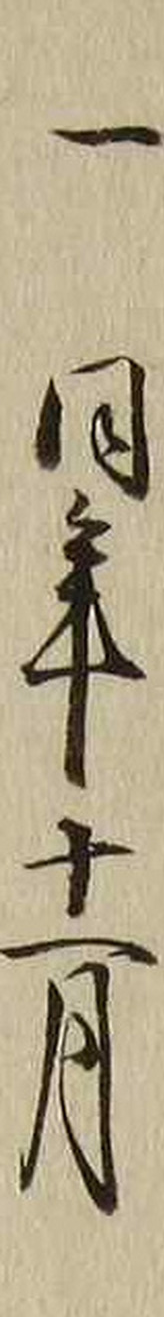一同年十一月
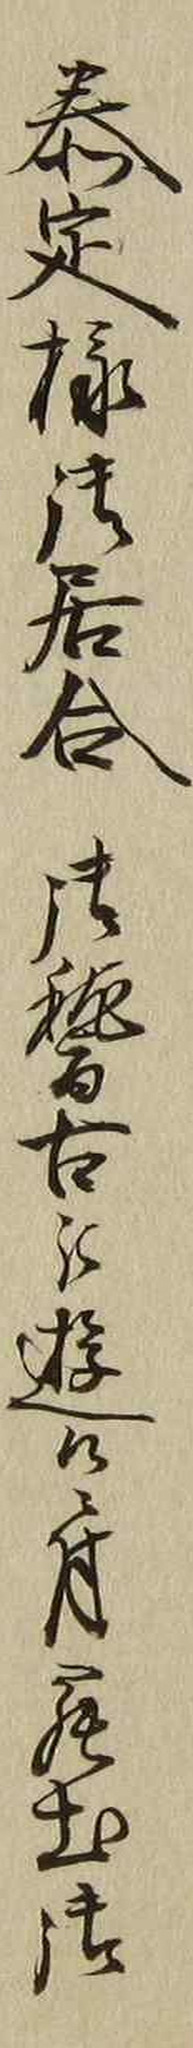恭定様御居合御稽古被遊候に付罷出御
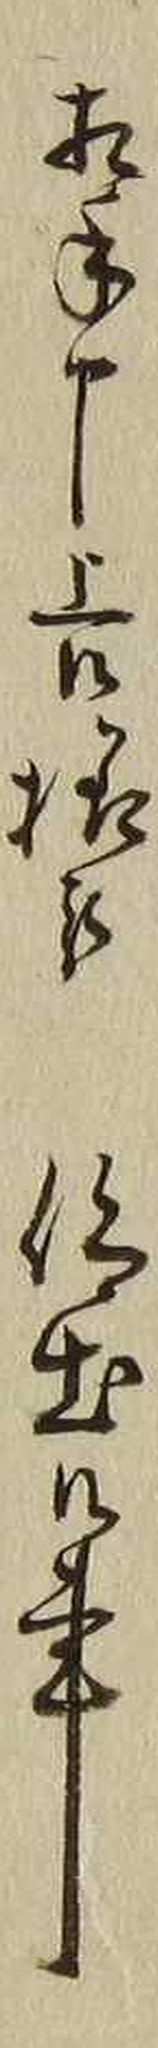相手申上候様被仰出候事
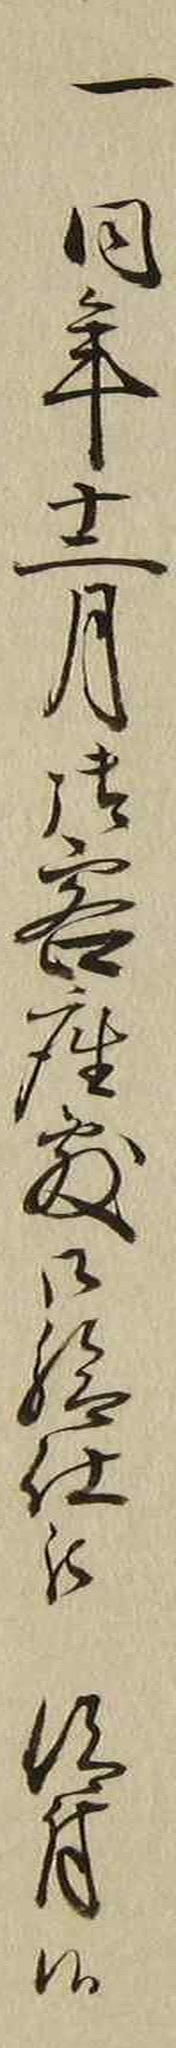一同年十二月御客座敷御給仕被仰付候
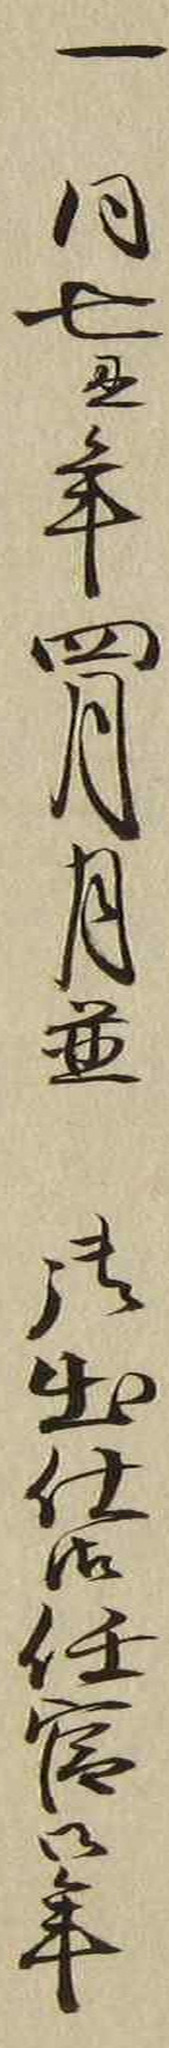一月七丑年四月並御出仕御任官御年
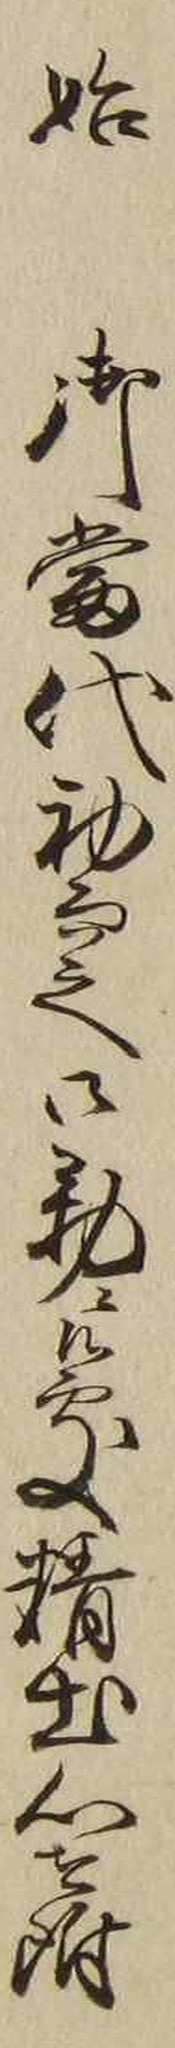始御当代初而之御勤に候処精出心を附

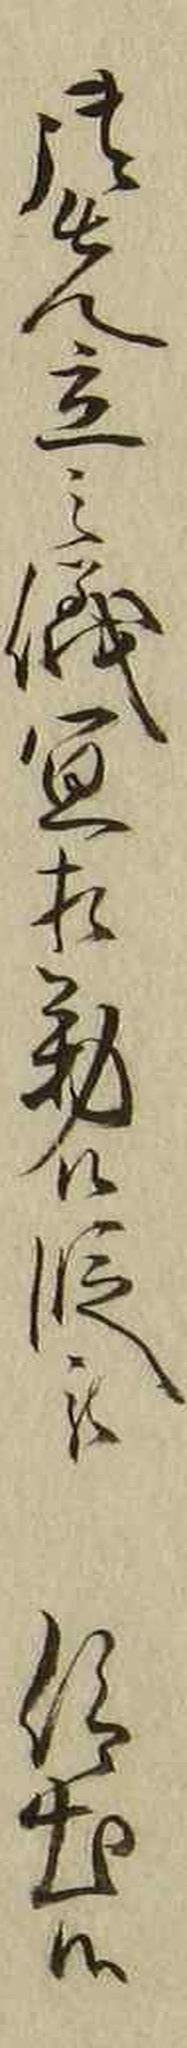御先立之儀宜相勤候段被仰出候
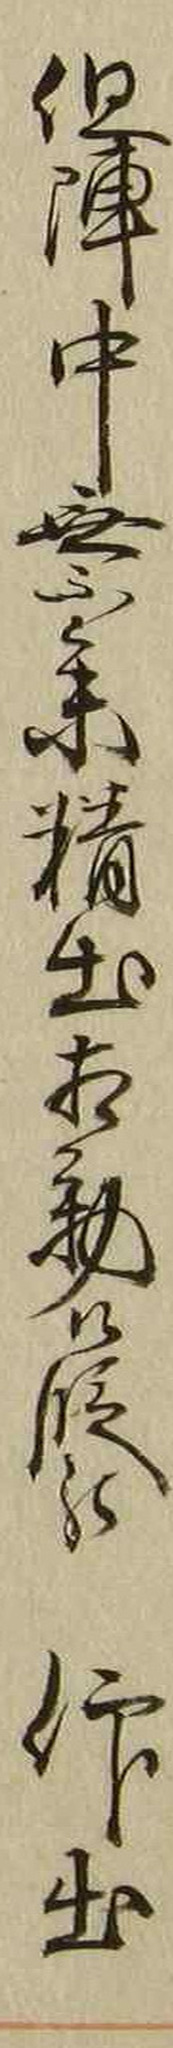但陣中無不参精出相勤候段被仰出
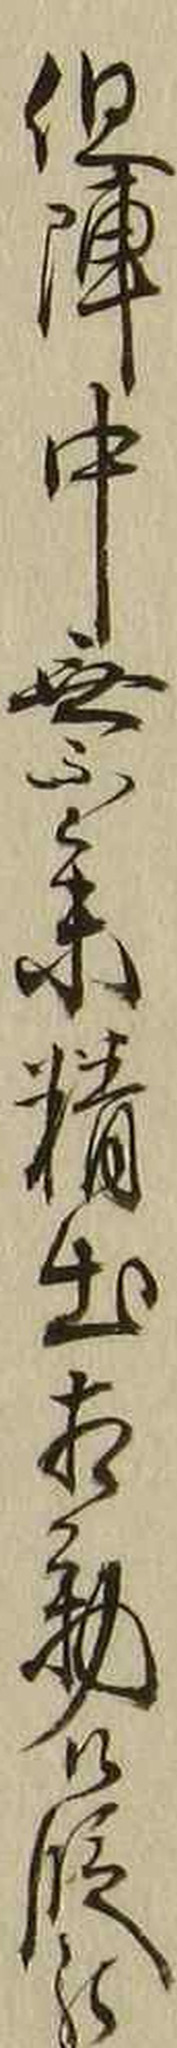但陣中無不参精出相勤候段被仰出
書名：諸士系譜　巻之67　を之部1
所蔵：会津若松市立会津図書館
